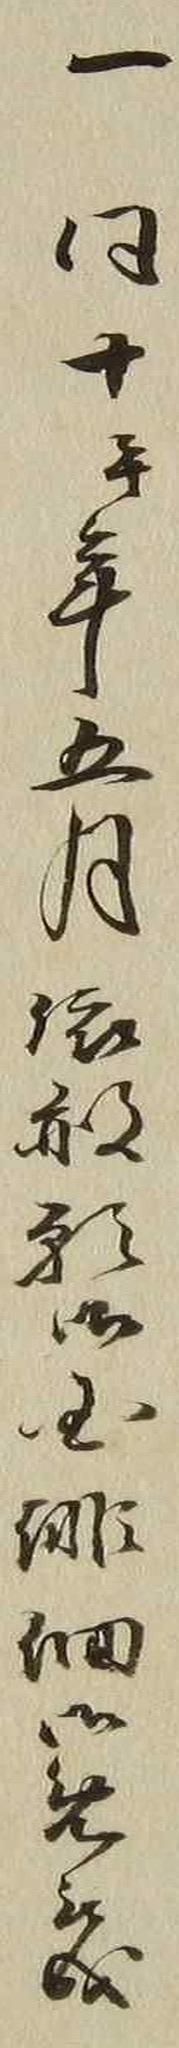一同十午年五月依赦願御国徘徊御免被成
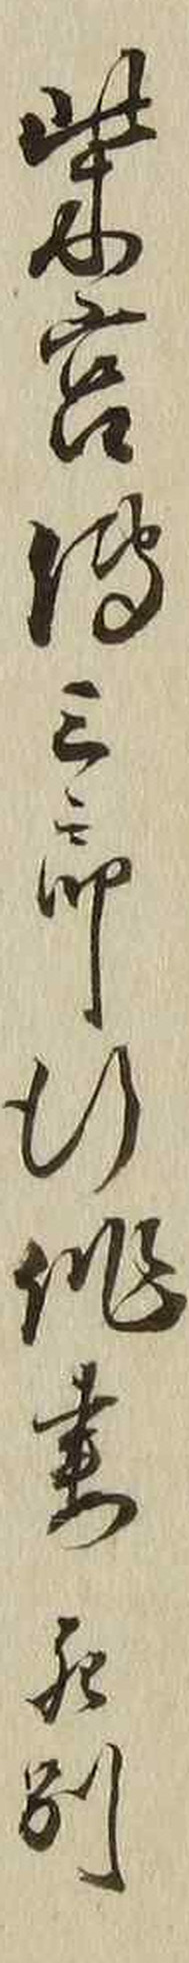女柴宮伝三郎得作妻死別
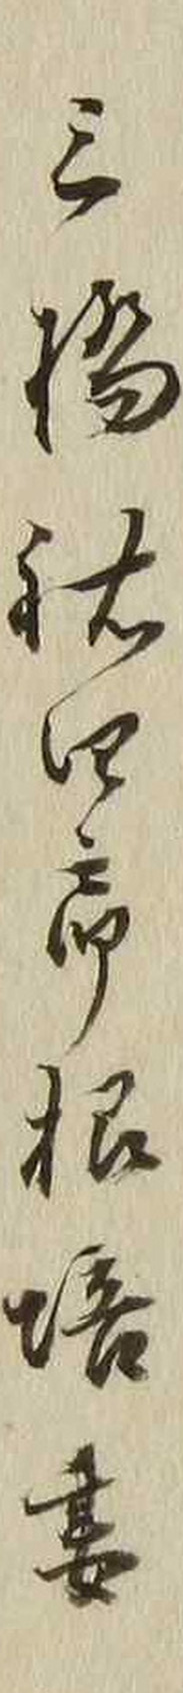三橋祐四郎根接妻
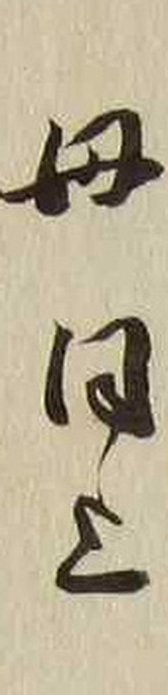母同上
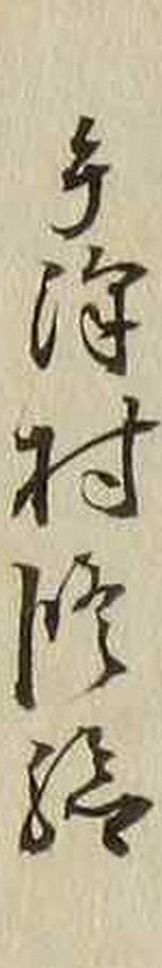手沢村修験
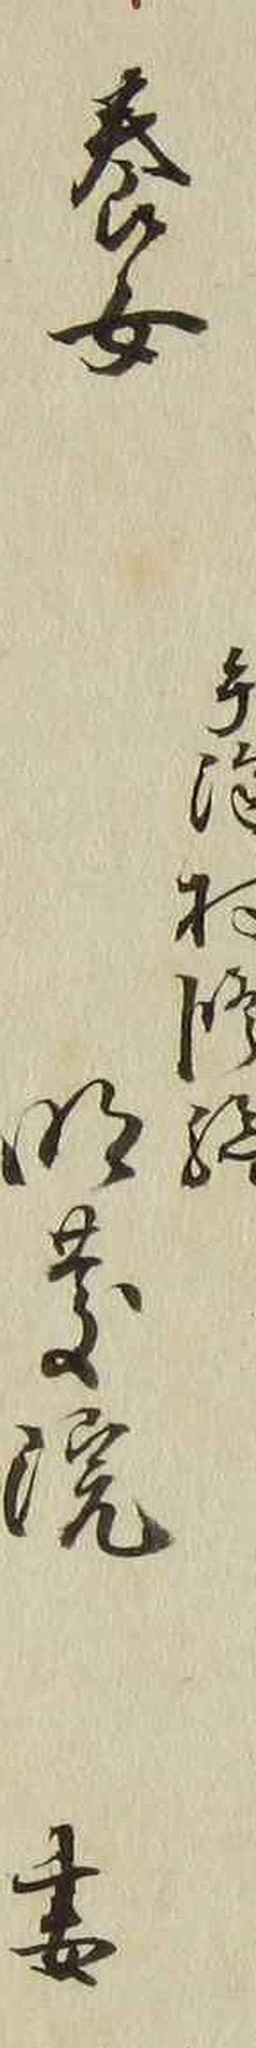養女明慶院妻
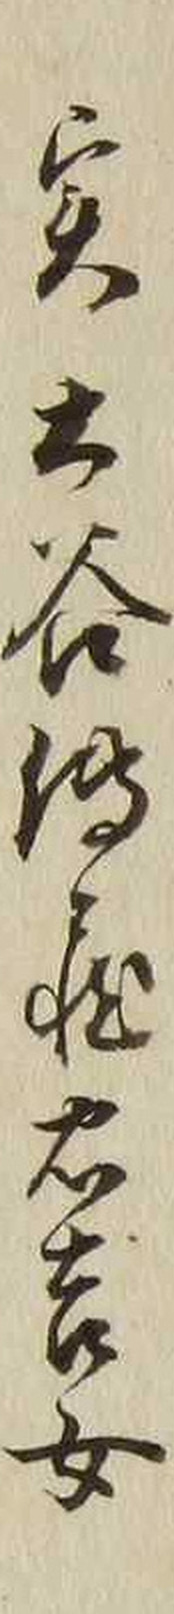実大谷伝蔵右吉女
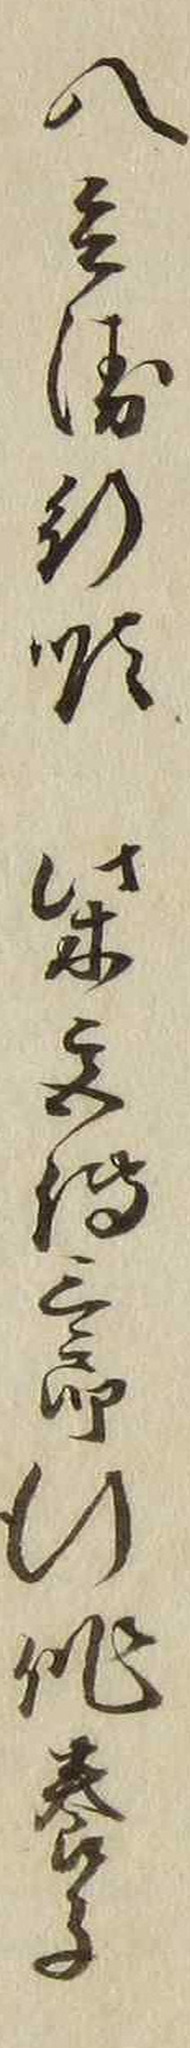八兵衛行順柴宮伝三郎得作養子
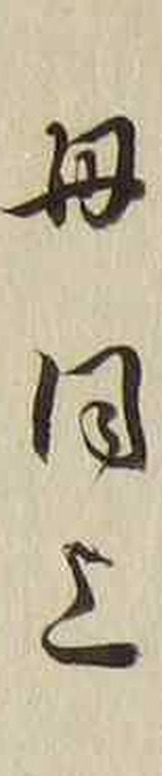母同上

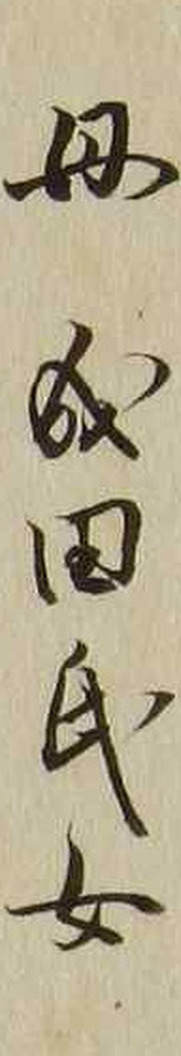母成田氏女
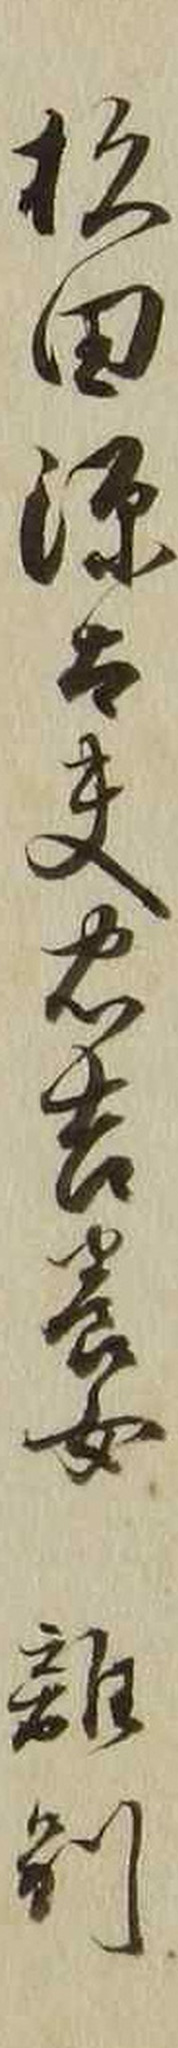杉田源太夫忠吉養女離別
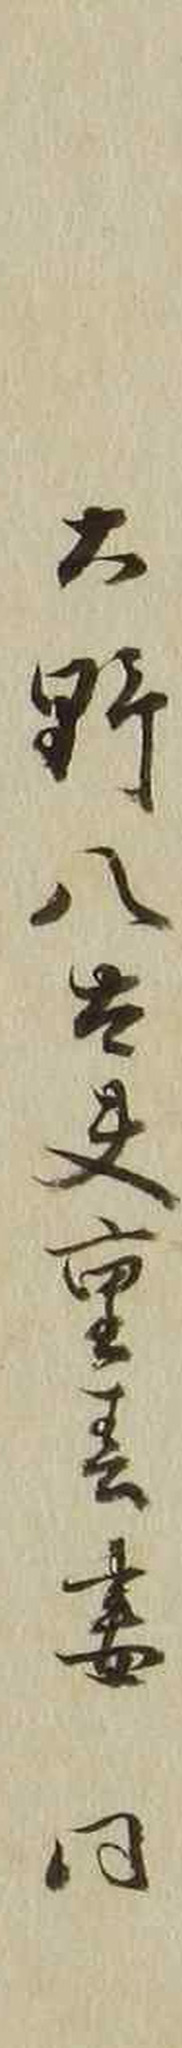女大野八太夫重春妻同
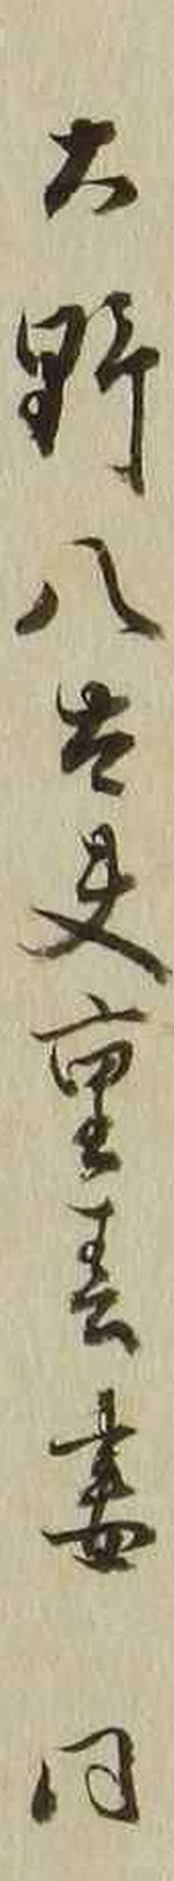女大野八太夫重春妻同
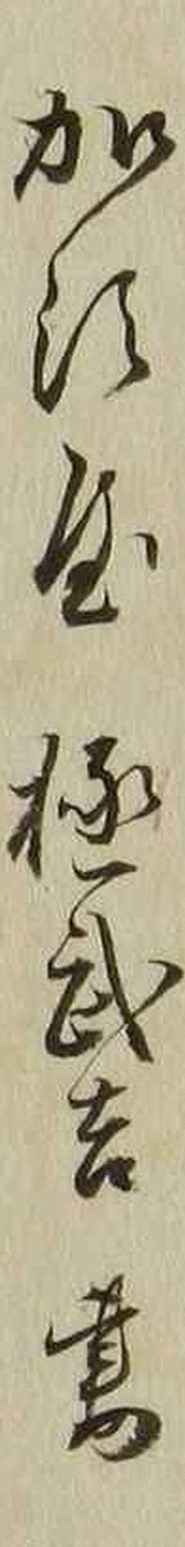加須屋極武吉妻
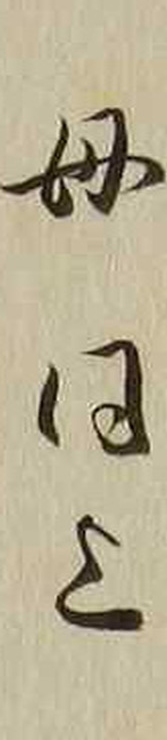母同上
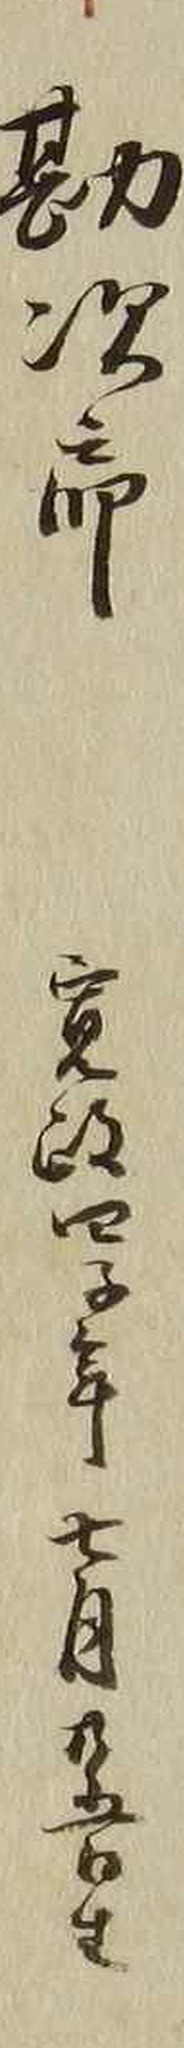勘次郎寛政四子年七月廿五日生
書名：諸士系譜　巻之26　い之部26
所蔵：会津若松市立会津図書館
